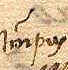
tm̄pus
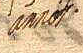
annos
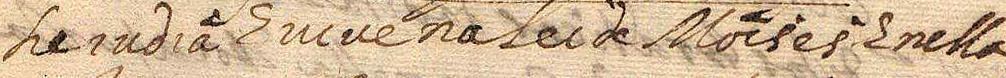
he iudia E uiue na Lei de Moises E nella
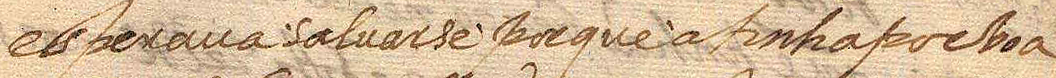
esperaua saluarse porque a tinha por boa
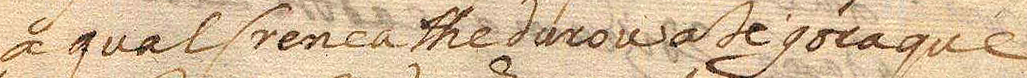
a qual Crença lhe durou ategora que
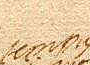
tempus
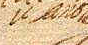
11 anos
